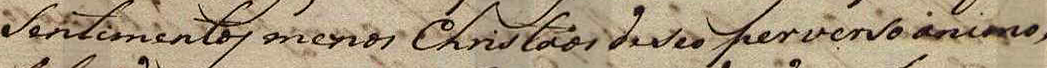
sentimentos menos Christaõs de seo perverso animo,
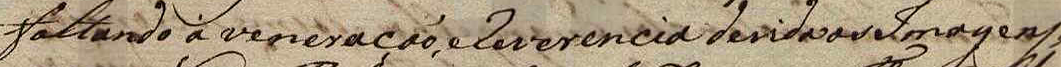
faltando a veneraçaõ, e Reverencia devida as Imagens,
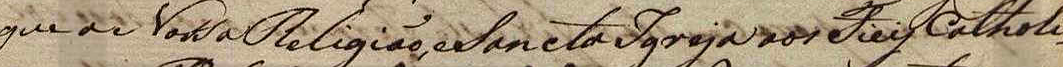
que a Nossa Religiaõ, e Sancta Igreja aos Fieis Catholi
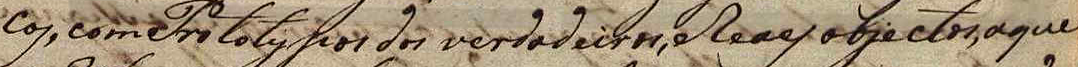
cos, como Prototypos dos verdadeiros, e Reais objectos, a que
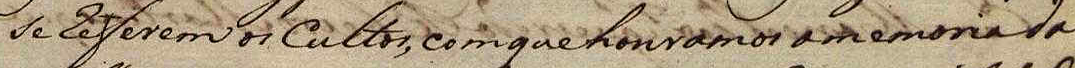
se Referem os Cultos, com que honramos a memoria da
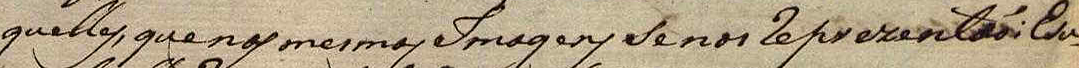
quelles, que nas mesmas Imagens se nos Reprezentaõ: E su
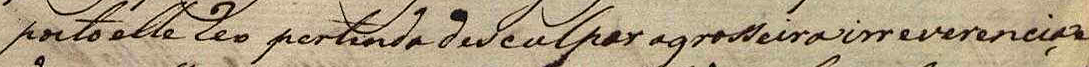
ponto elle Reo pertenda desculpar a grosseira irreverencia, e
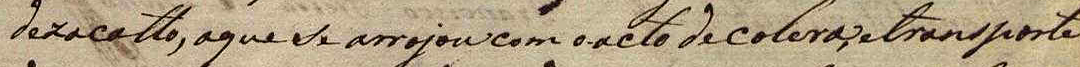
dezacatto, a que se arrojou com o acto de colera, transporte
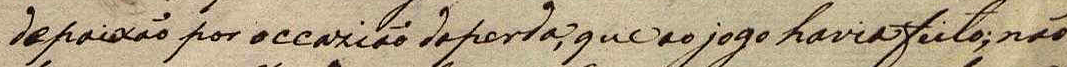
de paixaõ, por occaziaõ da perda, qua ao jogo havia feito, naõ
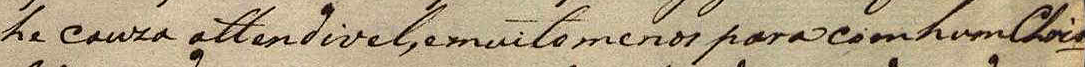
he cauza attendivel, e muito menos para com hum Chris
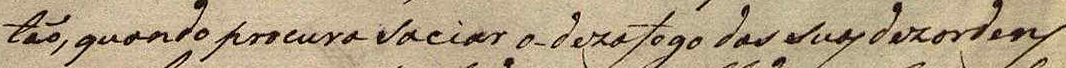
taõ, quando procura saciar o dezafogo das suas dezordens
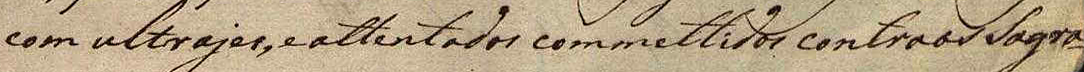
com ultrajes, e attentados commettidos contra as Sagra
